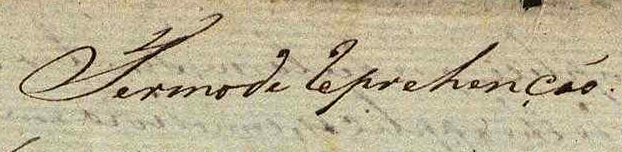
Termo de Reprehençaõ.
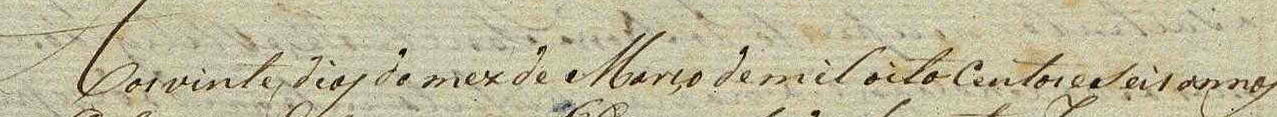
Aos vintes dias do mez de Março de mil oitocentos e seis annos
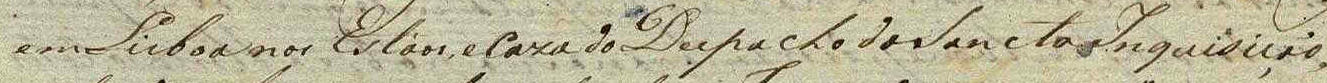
em Lisboa nos Estáos, e Caza do Despacho da Sancta Inquisiçaõ,
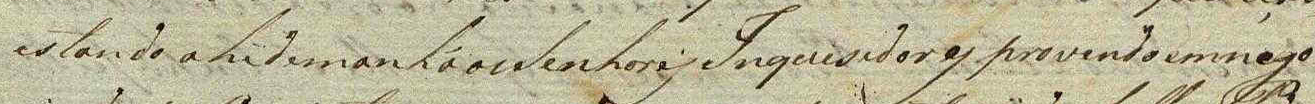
estando ahi de manhã os Senhores Inquisidores provendo em nego
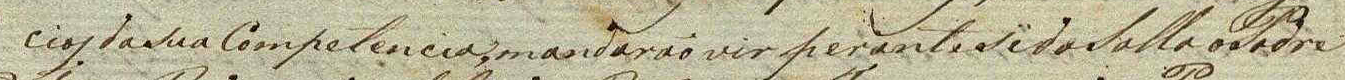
cios da sua Competencia, mandaraõ vir perante si da Salla o Padre
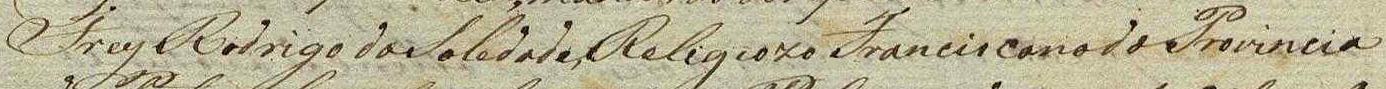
Frey Rodrigo da Saledade, Religiozo Franciscano da Provincia
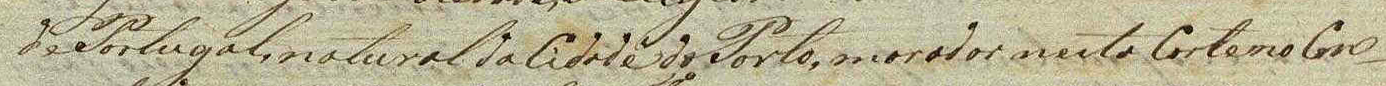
de Portugal, natural da Cidade do Porto, morador nesta Corte no Con
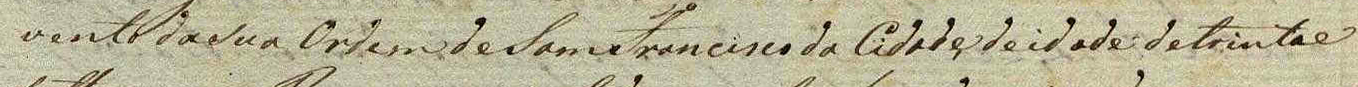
vento da sua Ordem de Sam Francisco da Cidade, de idade de trinta e
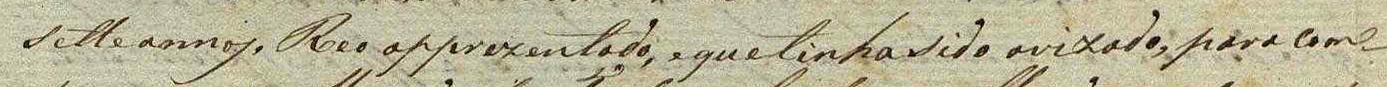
sette annos. Reo apprezentado, e que tinha sido avizado, para com
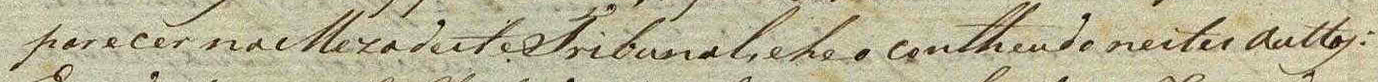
parecer na Meza deste Tribunal, e he o contheudo nestes auttos:
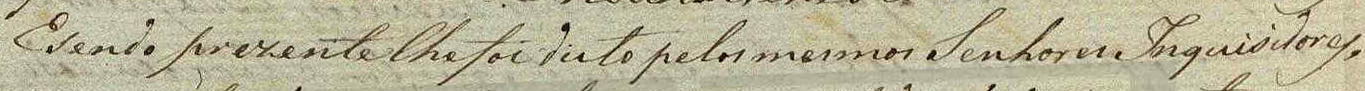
E sendo prezente lhe foi dicto pelos mesmos Senhores Inquisidores,
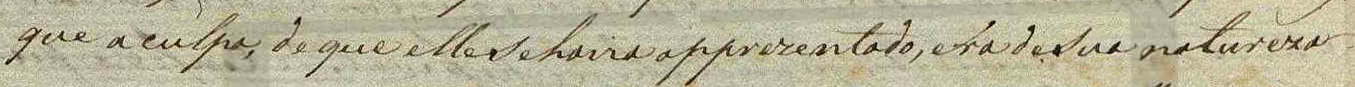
que a culpa, de que elle se havia apprezentado, era de sua natureza
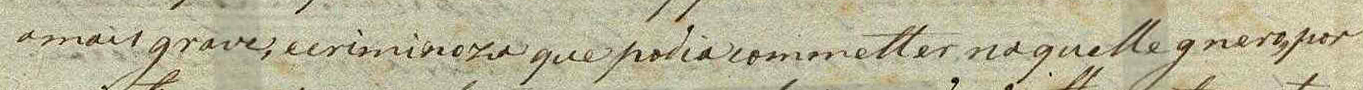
a mais grave, e criminoza que podia commetter naquelle gnero, por
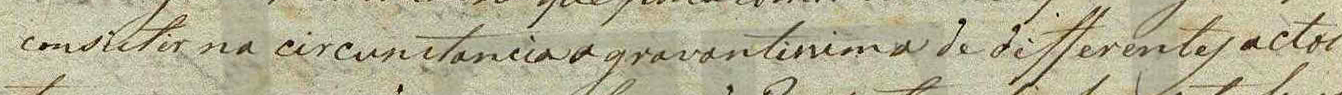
consistir na circunstancia a gravantissima de differentes actos
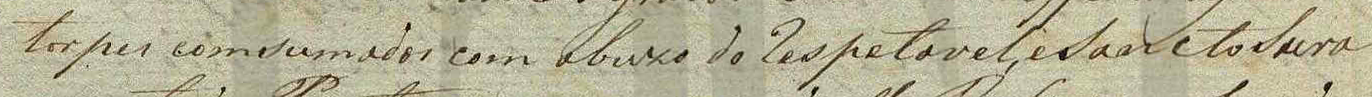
torpes comsumados com abuzo do Respetavel, e Sancto Iura
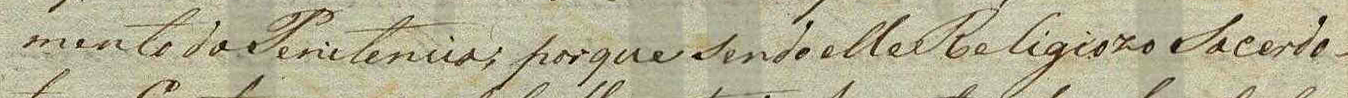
mento da Penitencia, porque sendo elle Religiozo Sacerdo
